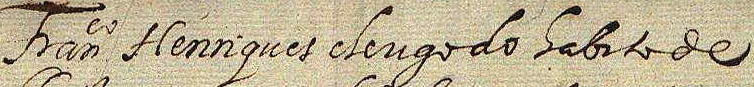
Franco Henriques clerigo do habito de
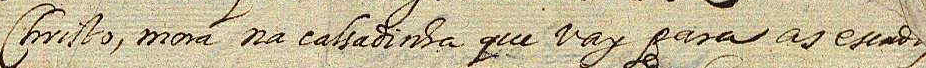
Christo, mora na calsadinha que vay para as escada
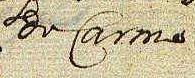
do Carmo
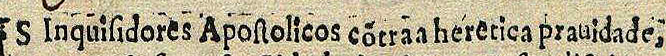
S Inquisidores Apostolicos cōtra a heretica prauidade,
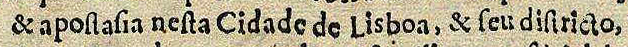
& apostasia nesta Cidade de Lisboa, & seu districto,
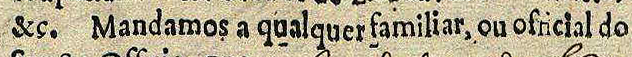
&c. Mandamos a qualquer familiar, ou official do
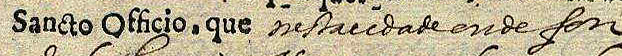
Sancto Officio, que nesta cidade onde for
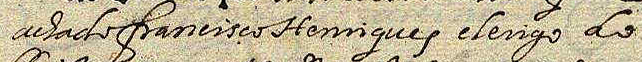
achado francisco Henriques clerigo do
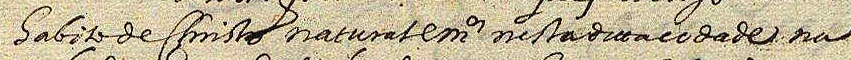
habito de Christo natural e mor nesta ditta cidade na
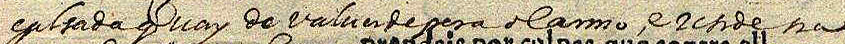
calsada q̄ uay de valuerde pera o Carmo, e reside na
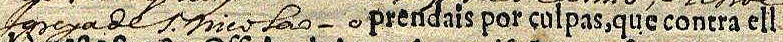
Jgreya de s. nicolao o prendais por culpas, que contra ell
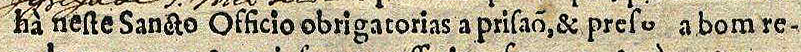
hà neste Sancto Officio obrigatorias a prisaõ, & preso a bom re
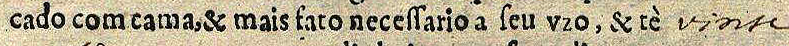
cado com cama, & mais fato necessario a seu vzo, & tè vinte
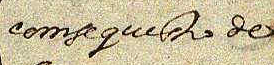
com sequestro de
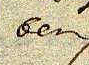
bens
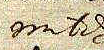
mil rs̄
